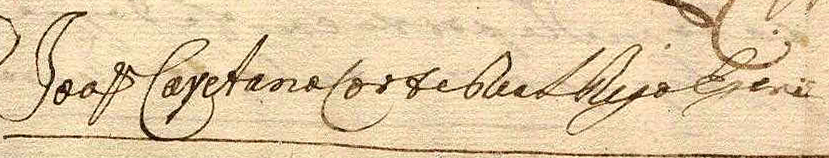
Ioaõ Cayetano Corte Real Rego Escri
